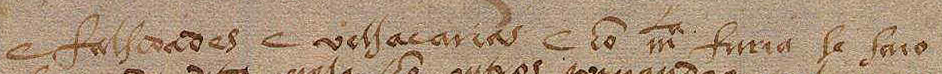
e falsidades e velhacarias e cō mta furia se saio
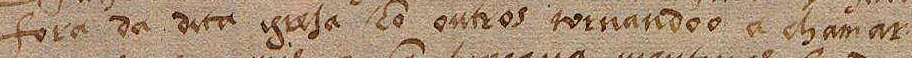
fora da dita igreJa cō outros tornandoo a chamar
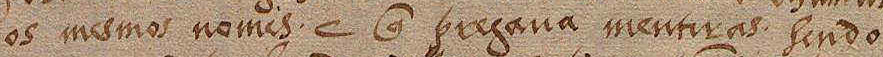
os mesmos nomes. e q̄ pregaua mentiras sendo
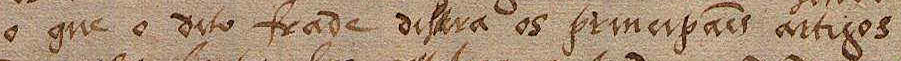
o que o dito frade dissera os principāes artigos
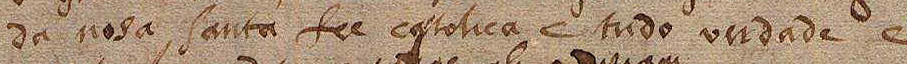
da nosa santa fee catolica e tudo verdade e
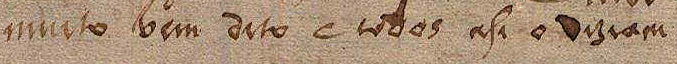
muito bem dito e todos asi o diziam
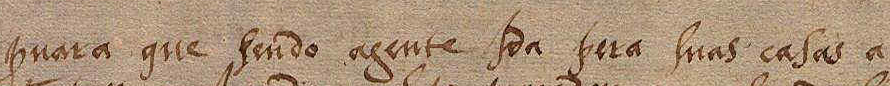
ꝓuara que sendo a gente Jda pera suas casas a
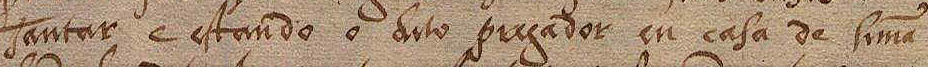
jantar e estando o dito pregador en casa de Simā
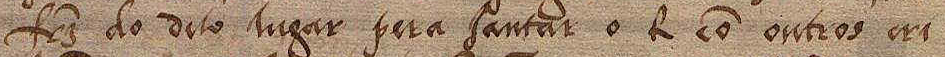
frz̄ do dito lugar pera Jantar o R cō outros cri
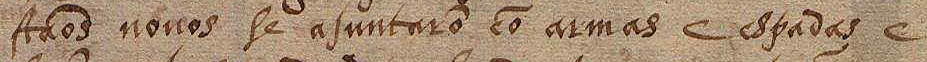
stãos nouos se aJuntarō cō armas e espadas e
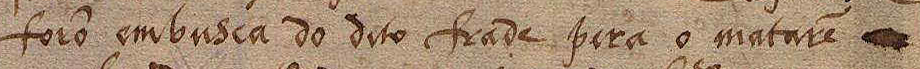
forō em busca do dito frade pera o matarē
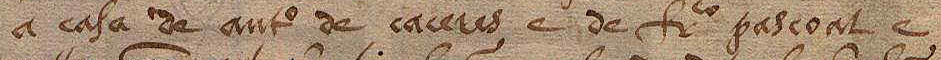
a casa de anto de caceres e de frco pascoal e
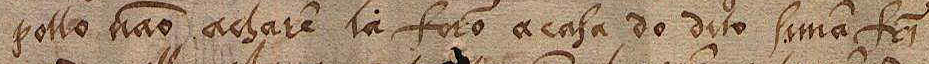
pollo não acharē la forō a casa do dito simā frz̄
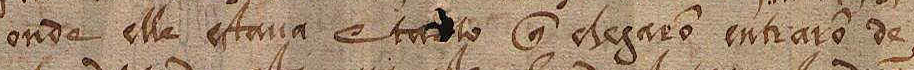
onde elle estaua e tanto q̄ chegarō entrarō de
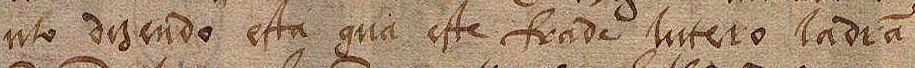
nto dizendo esta qua este frade lutero ladrā
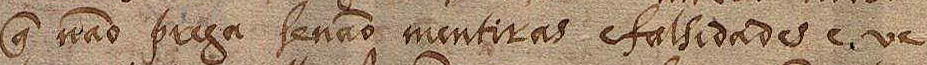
q̄ não prega senão mentiras e falsidades e ve
